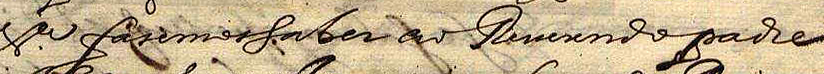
lhe fazemos saber ao Reuerendo padre
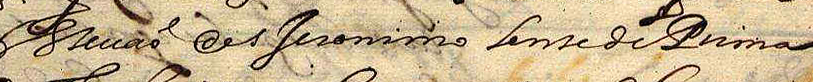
fr steuaõ de s Jeronimo lente de Prima
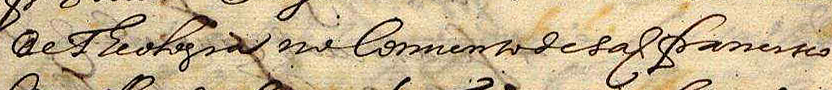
de Theologia no Conuento de saõ francisco
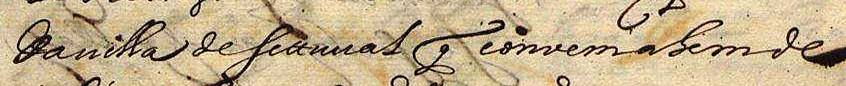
da uilla de settuual q̄ convem a bem de
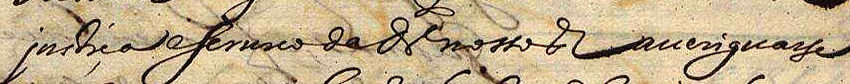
justiça e seruiço de Se nosso sor aueriguarse
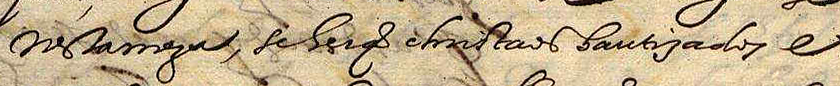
nesta meza, se heraõ christaõs bautizados e
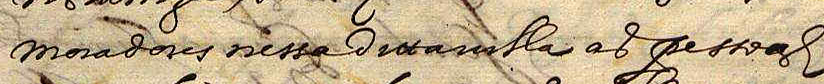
moradores nessa ditta uilla as pessoas
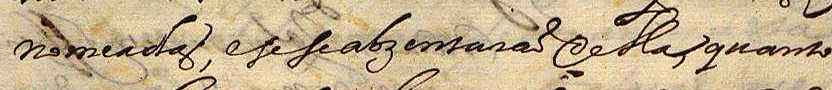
nomeadas, e se se abzentaraõ della, quanto
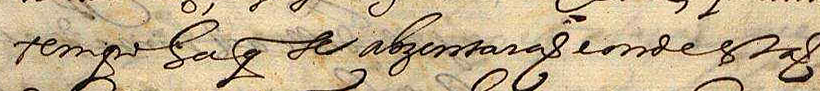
tempo ha q̄ se abzentaraõ e onde estaõ
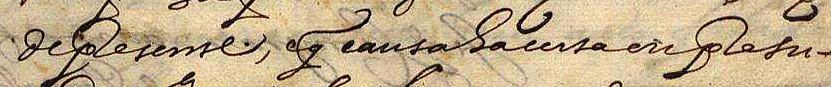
de presente, e q̄ causa ha certa ou presu
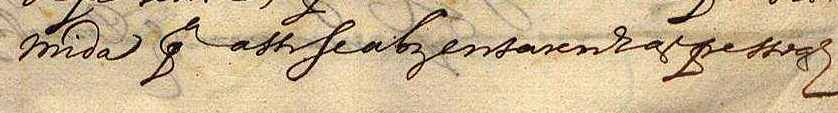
mida p̄a assi se abzentaren E q̄ pessoas
